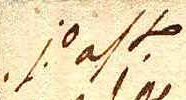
i.o as.to
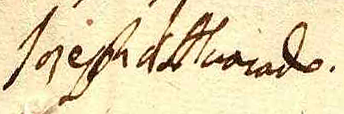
Iozeph d̄ Aluarado.
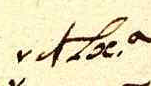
d̄ Lx.a
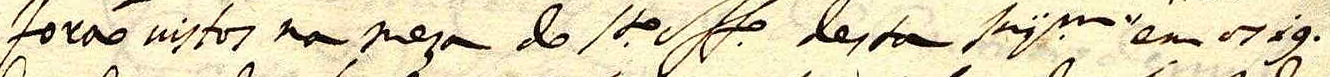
foraõ uistos na meza do st.o off.o desta Inq.m em os i9.
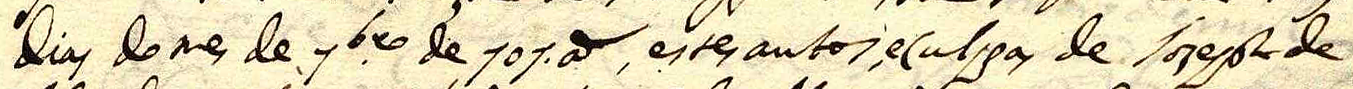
dias do mes de 7.bro de 707.ā estes autos, e Culpas de Iozeph de
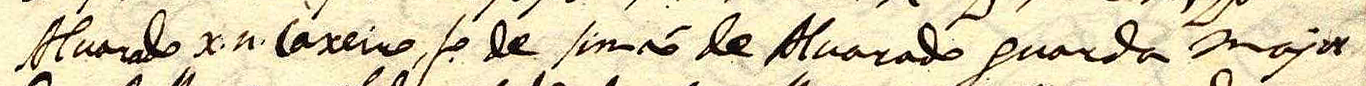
Aluarado x. n. caxeiro, f.o de Simaõ de Aluarado guarda major
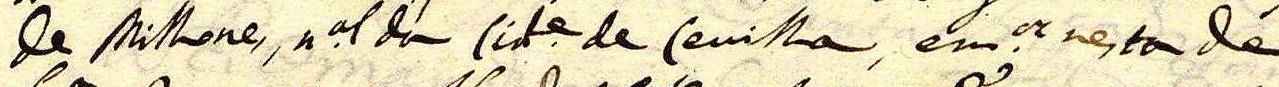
de Milhones, n.al da Cid̄.e de Ceuilha e m.or nesta de
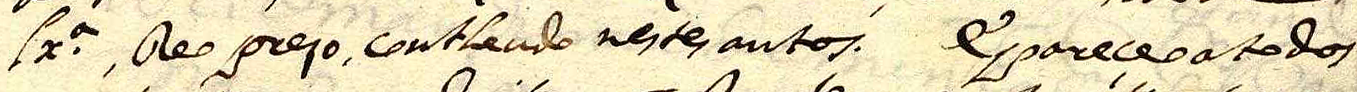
Lx.a Reo prezo, contheudo nestes autos; E pareceo a todos
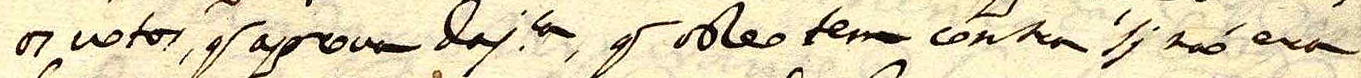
os uotos, q̄ a proua da j.ça, q̄ o Reo tem contra si naõ era
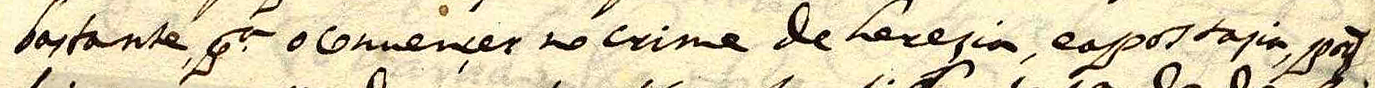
bastante, p.a o conuencer no crime de herezia, e apostasia, porq̄
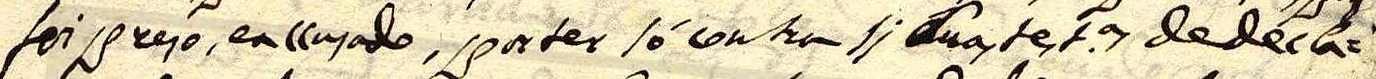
foi prezo, e accusado, por ter só contra si duas test.as de decla
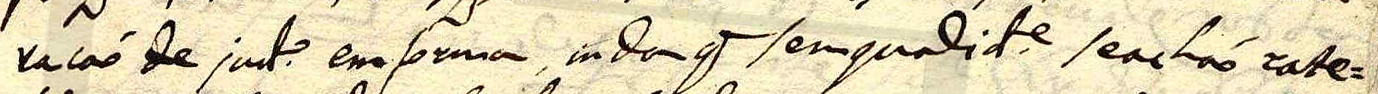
raçaõ de jud.o em forma, inda q̄ sem quadid̄.e se achaõ rate
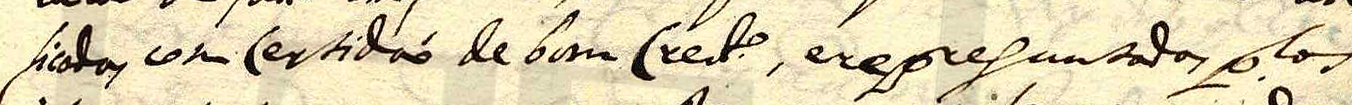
ficadas com certidaõ de bom Cred.o, e repreguntadas p.los
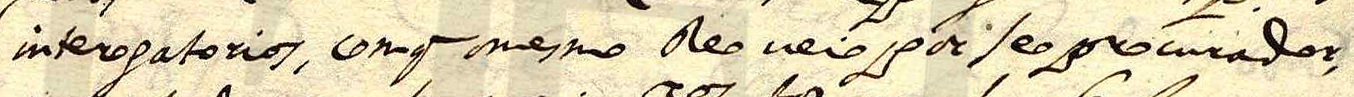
interogatorios, com q̄ o mesmo Reo ueio por seo procurador,
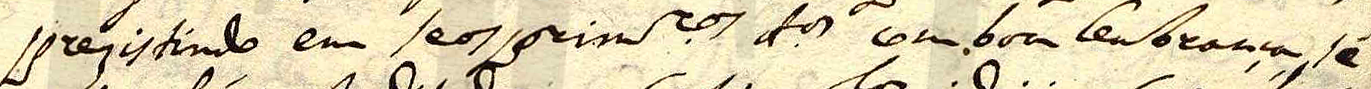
prezistindo em seos prim.ros d̄.os com boa lenbrança sē
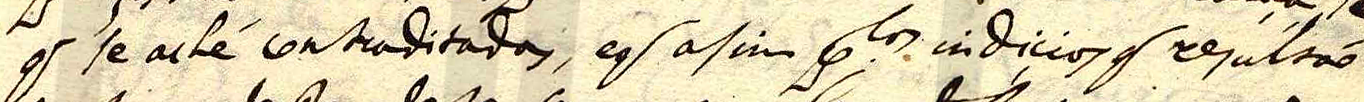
q̄ se achē contraditadas, e q̄ asim p.los indicios q̄ resultaõ
